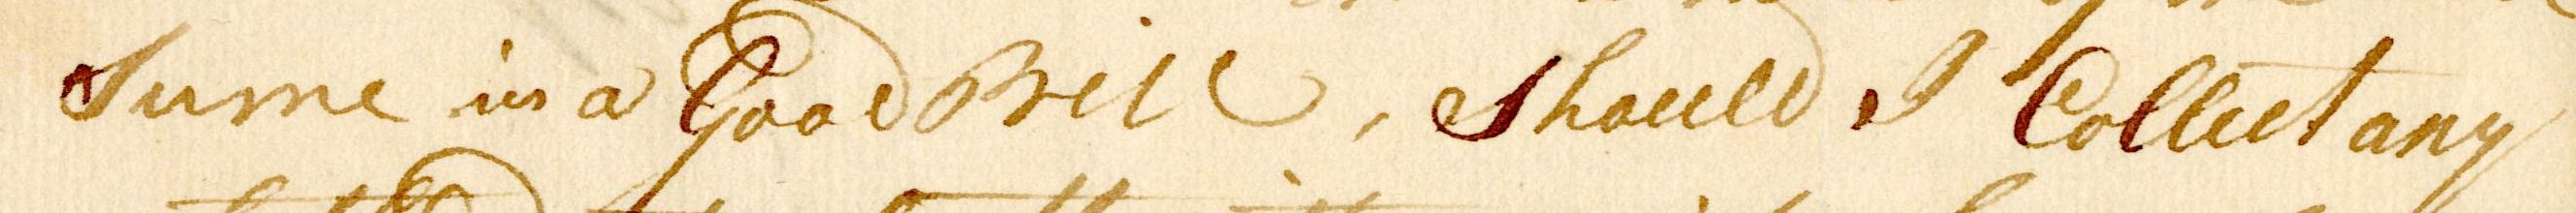Sume in a Good Bill, should I Collect any
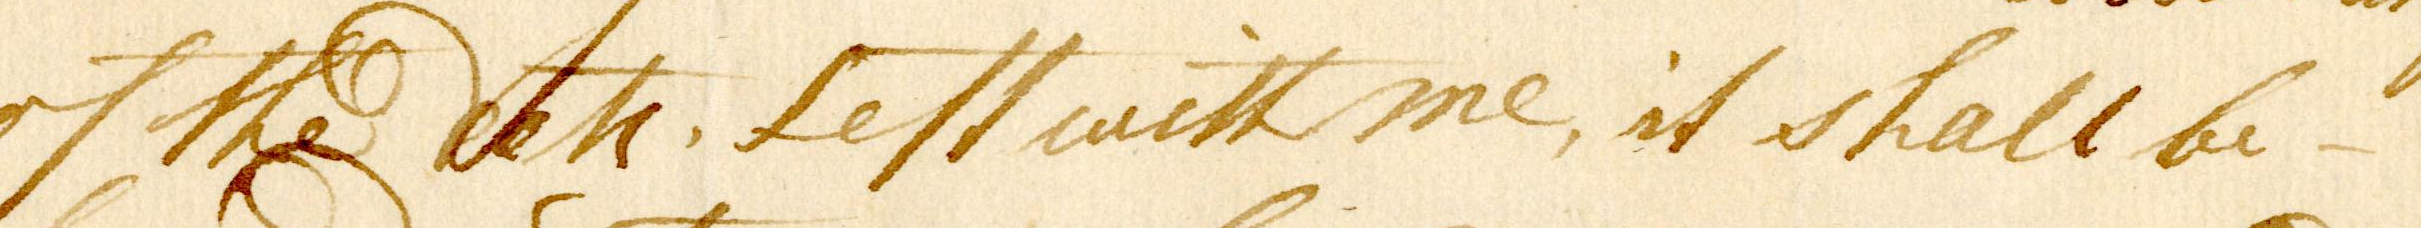of the dets, Left with me, it shall be-
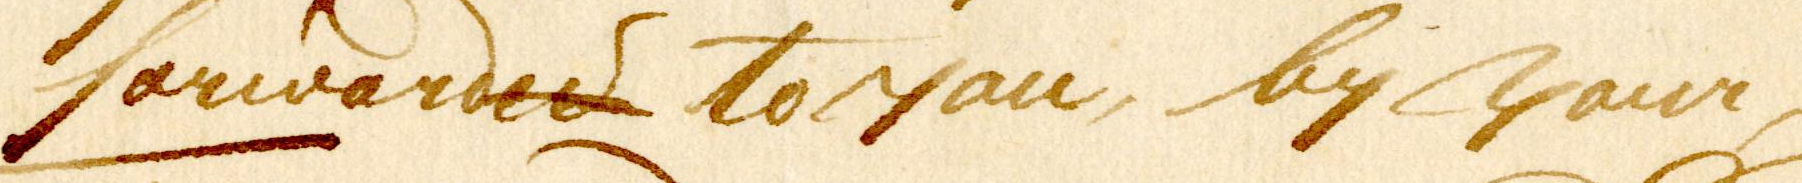forwarded to you, by Your
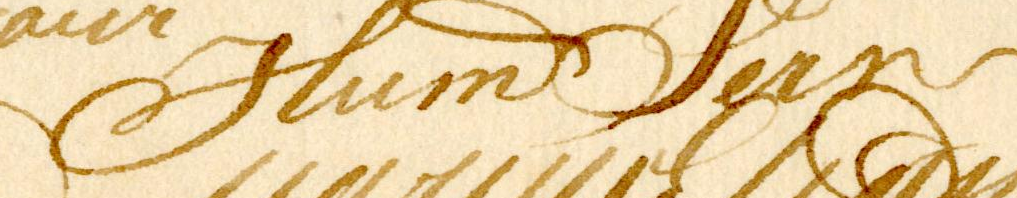Hum^l Serv
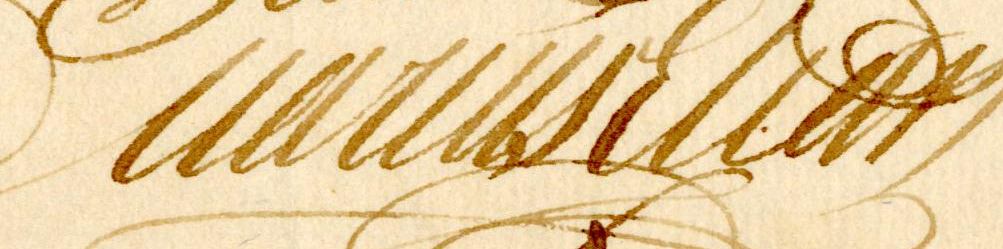Marcus Elcan
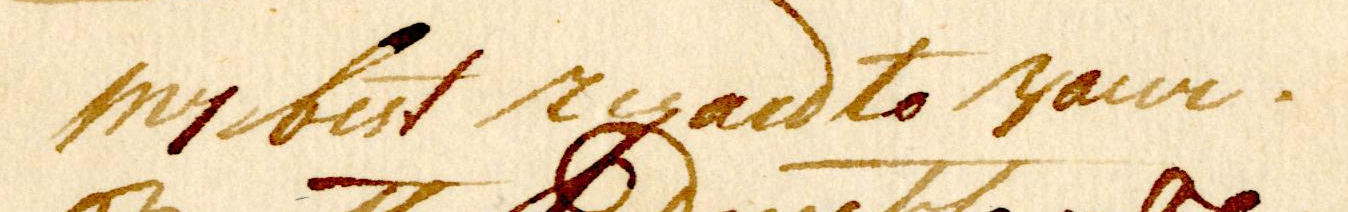My best regard to your.
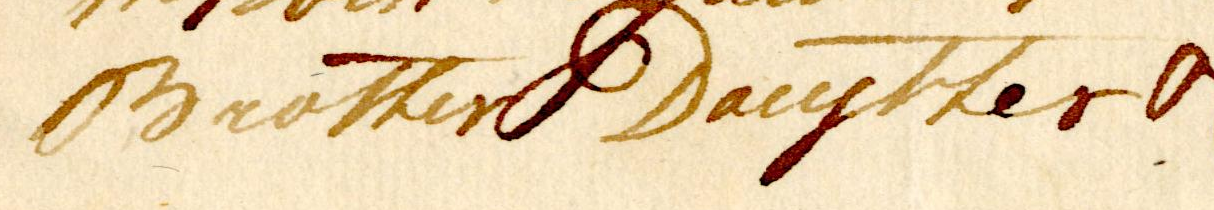Brother & Daughter &
